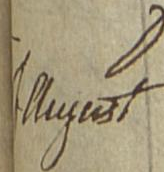August
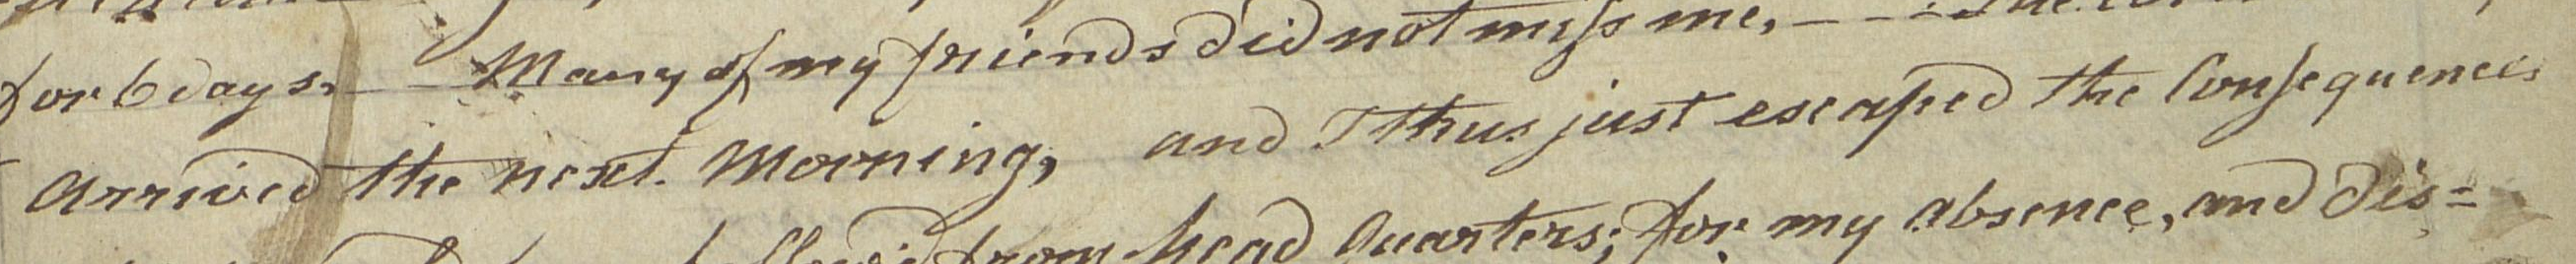arrived the next Morning, and I thus just escaped the Consequences
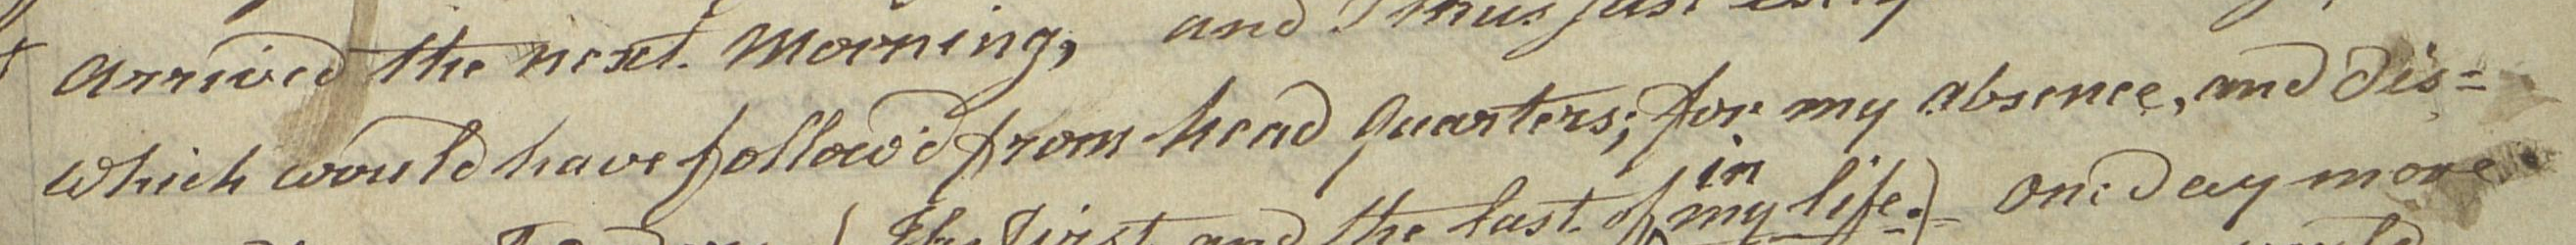which would have follow'd from head quarters; for my absence, and dis-
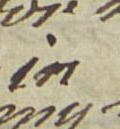in
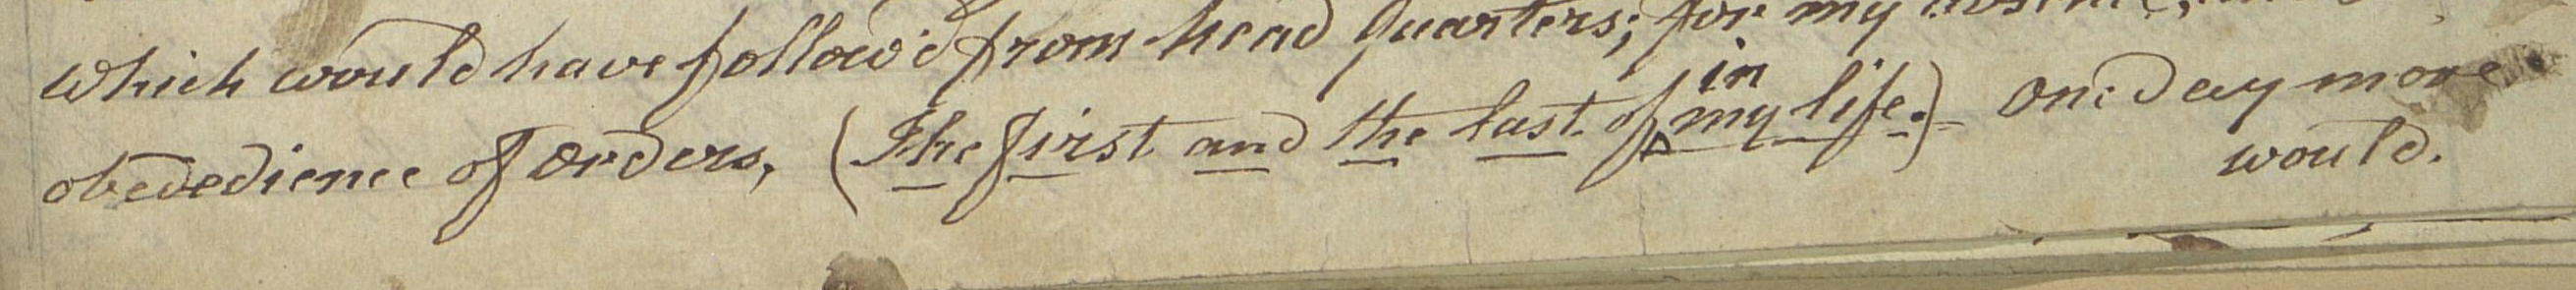obedience of orders, (The first and the last of ^ my life.) one day more
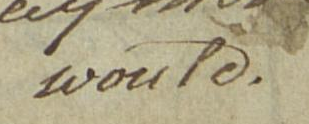would.
